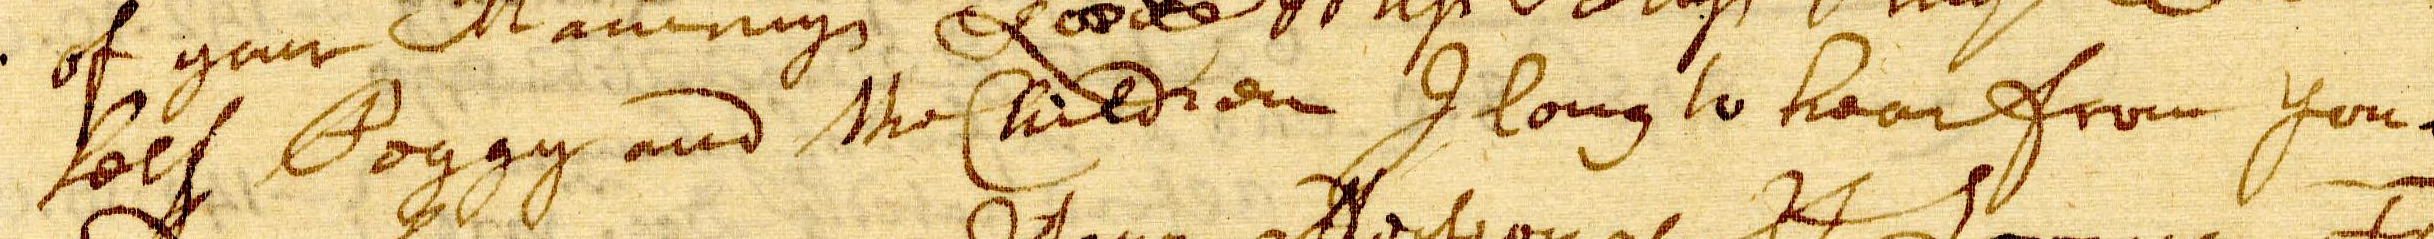self Peggy and the Children I long to hear from You
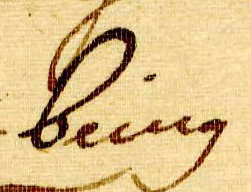being
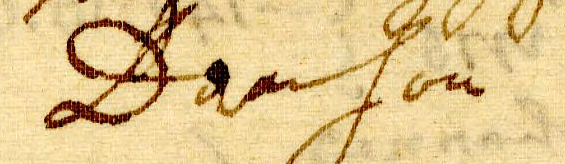Dear Son
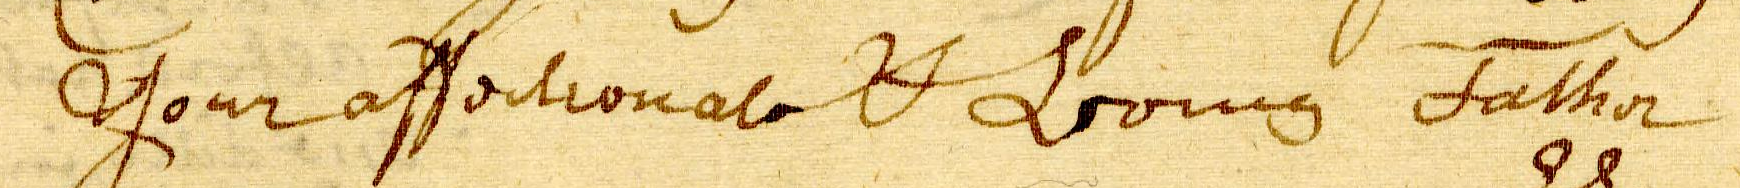Your affectionate & Loving Father
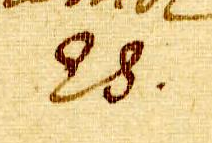ES.
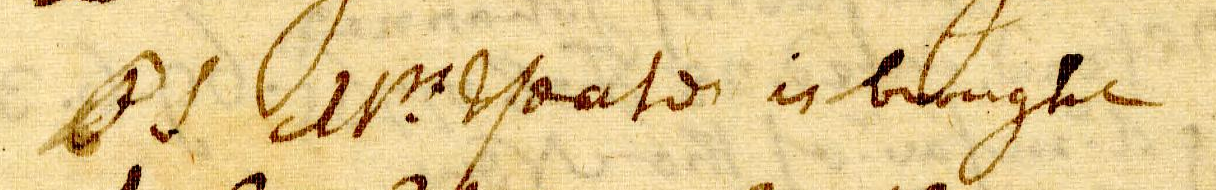PS M^r. Yeates is brought
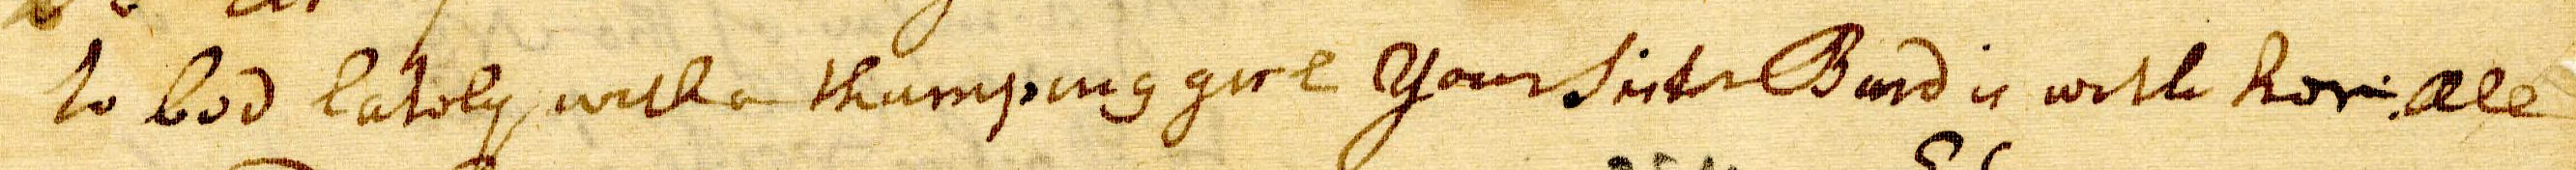to bed lately with a thumping girl Your Sister Burd is with her All
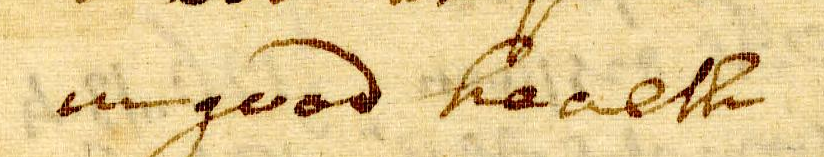in good health
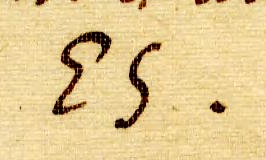ES.
